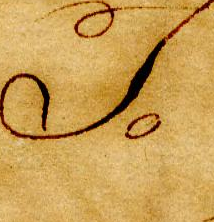To
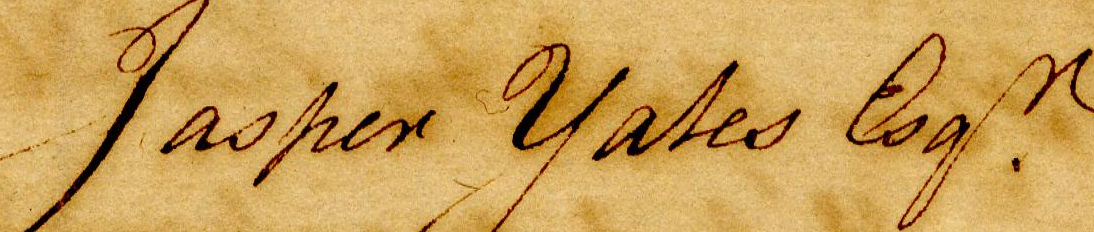Jasper Yates Esq^r.
